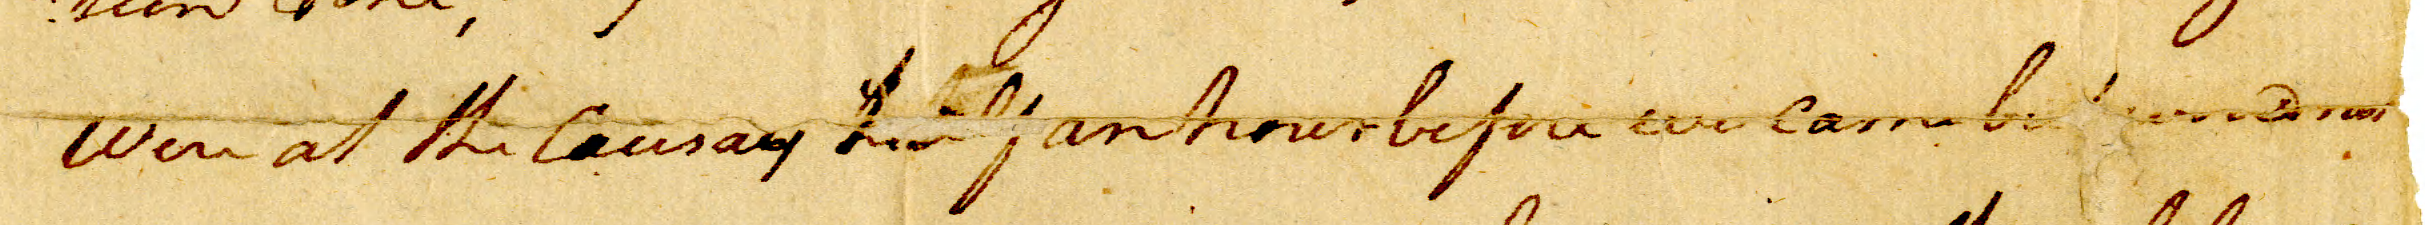were at the Causay half an hour before we came between
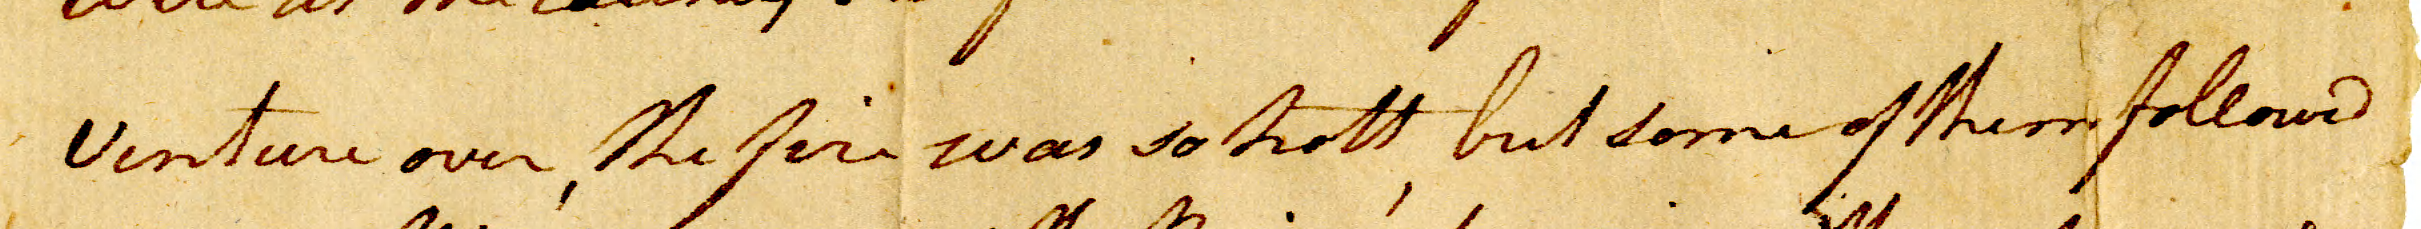venture over, the fire was so hott, but some of them followed
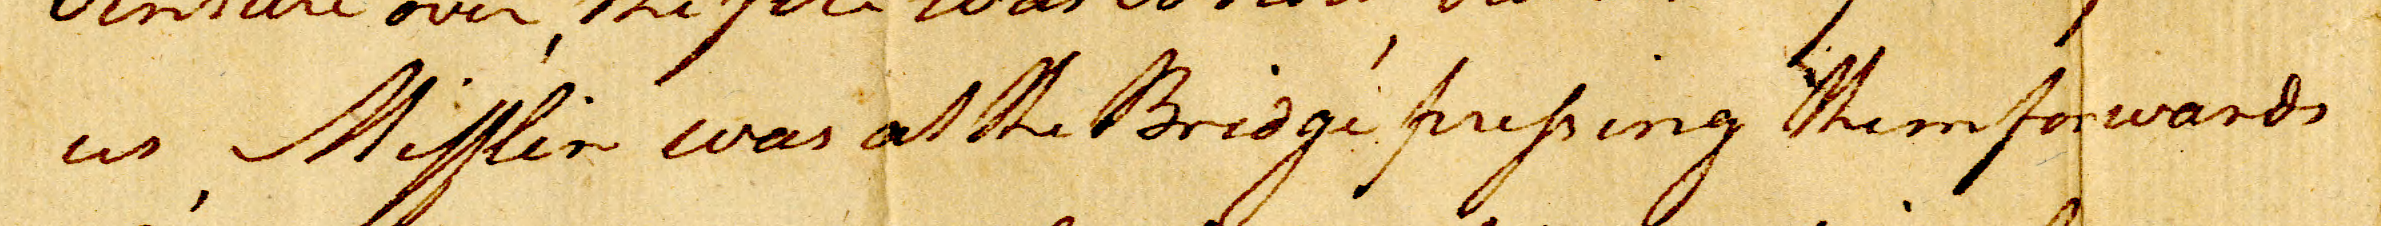us, Mifflin was at the Bridge pressing them forwards
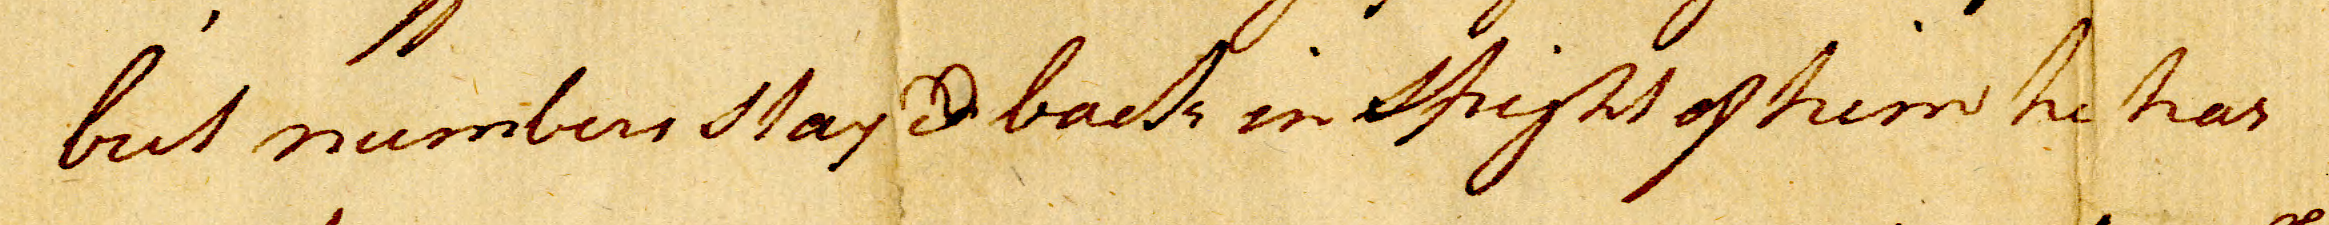but numbers stayed back in spight of him he has
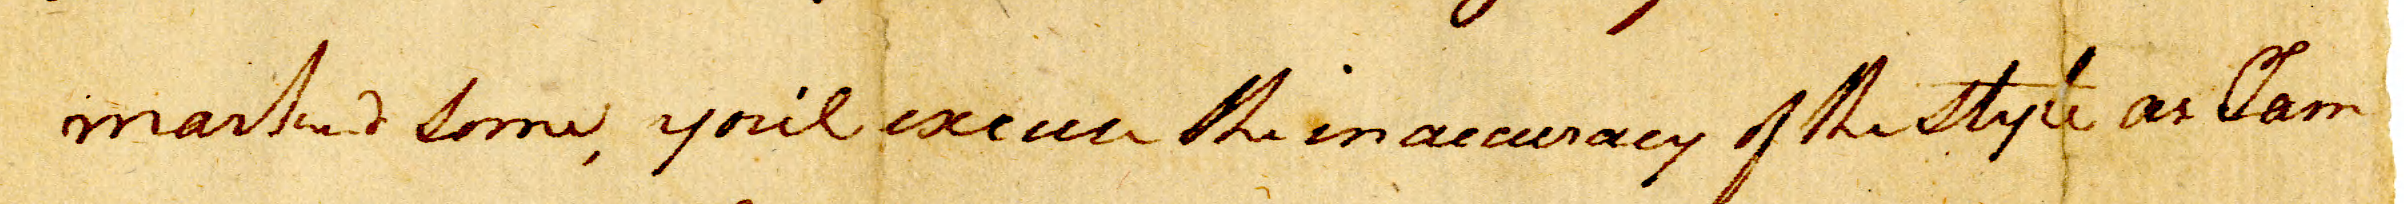marked some, you'l excuse the inaccuracy of the style as I am
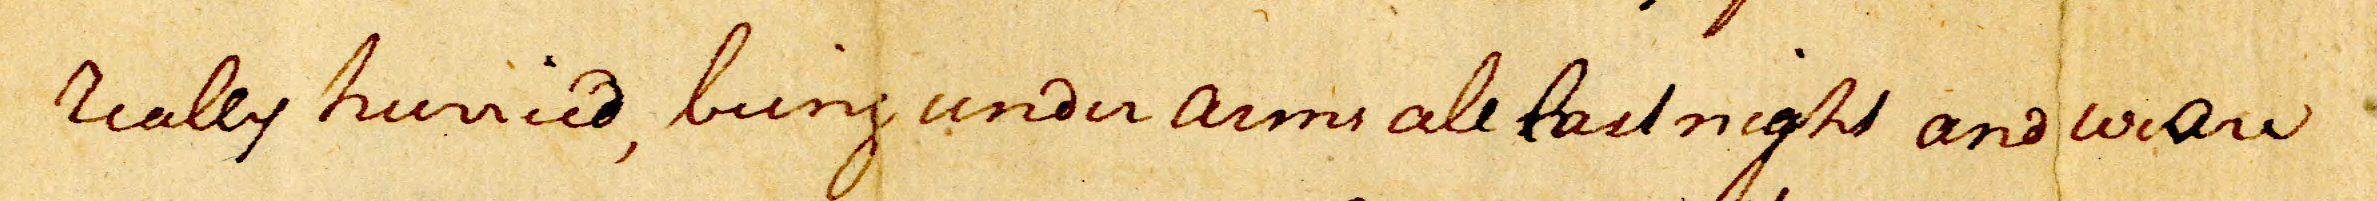really hurried, being under arms all last night and we are
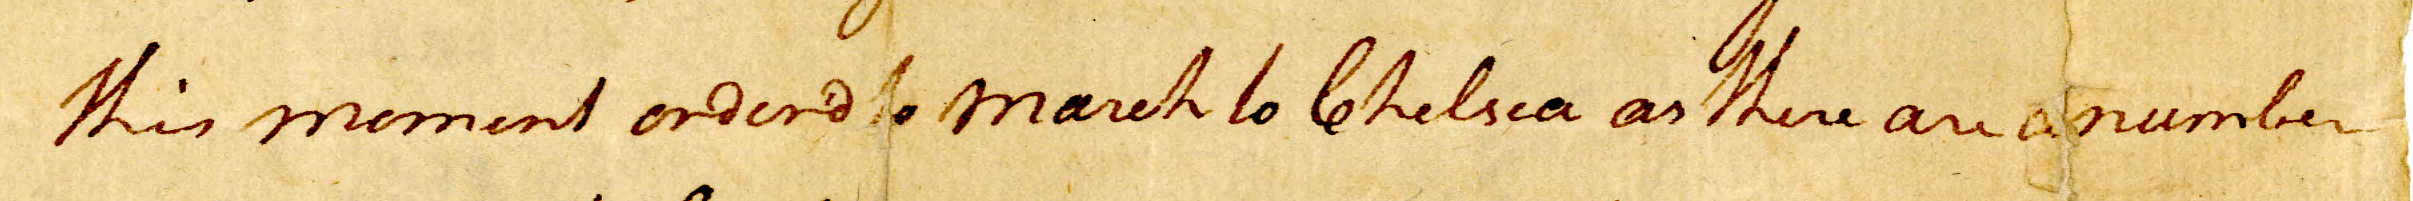this moment order'd to march to Chelsea as there are a number
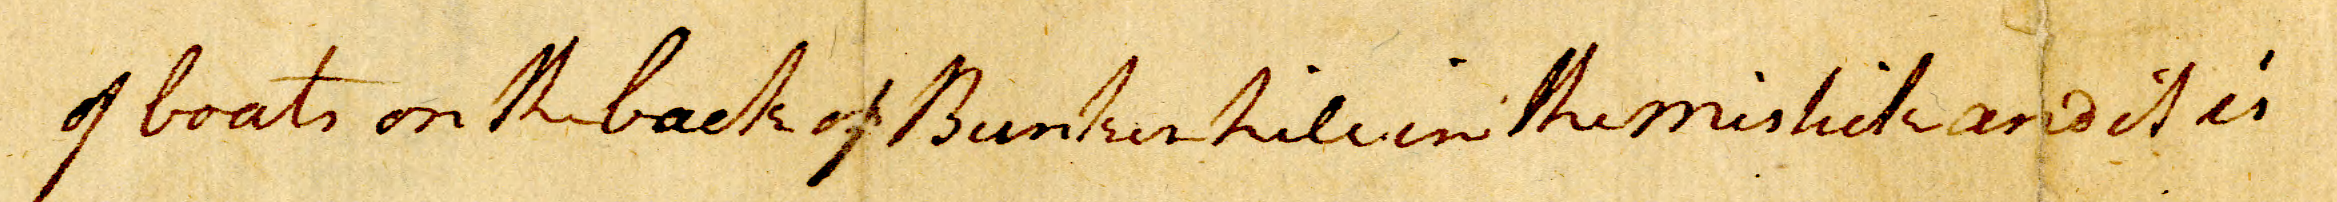of boats on the back of Bunker hill in the mistick and it is
